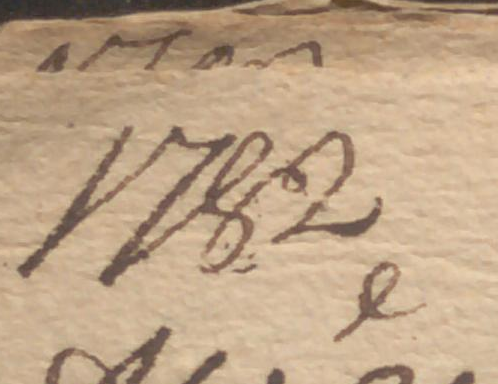1782
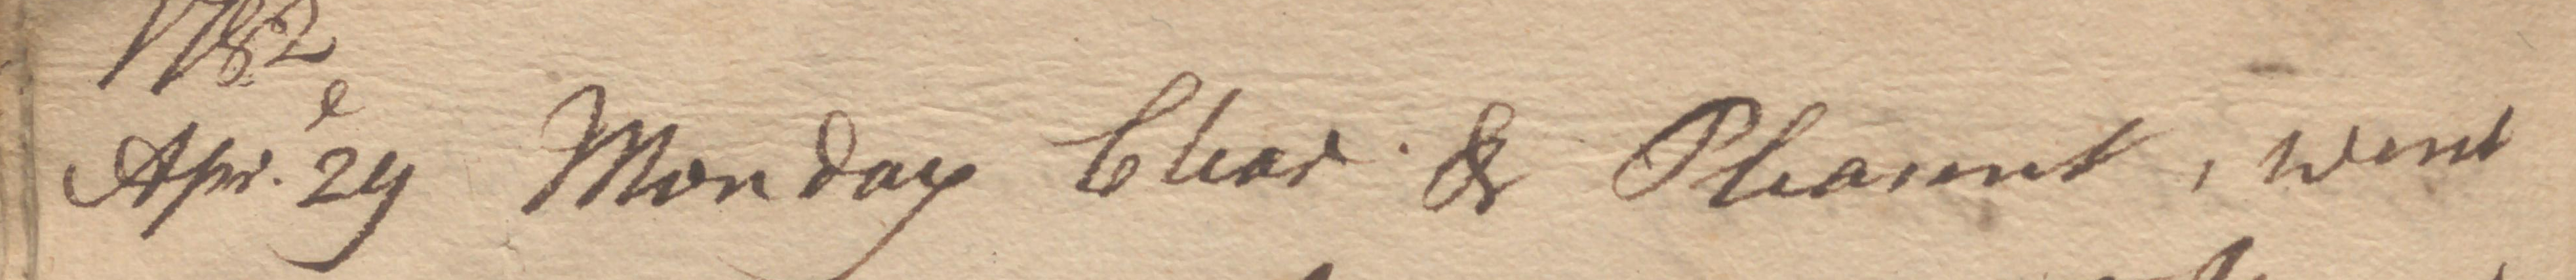Apr^l. 29 Monday Clear & Pleasent, went
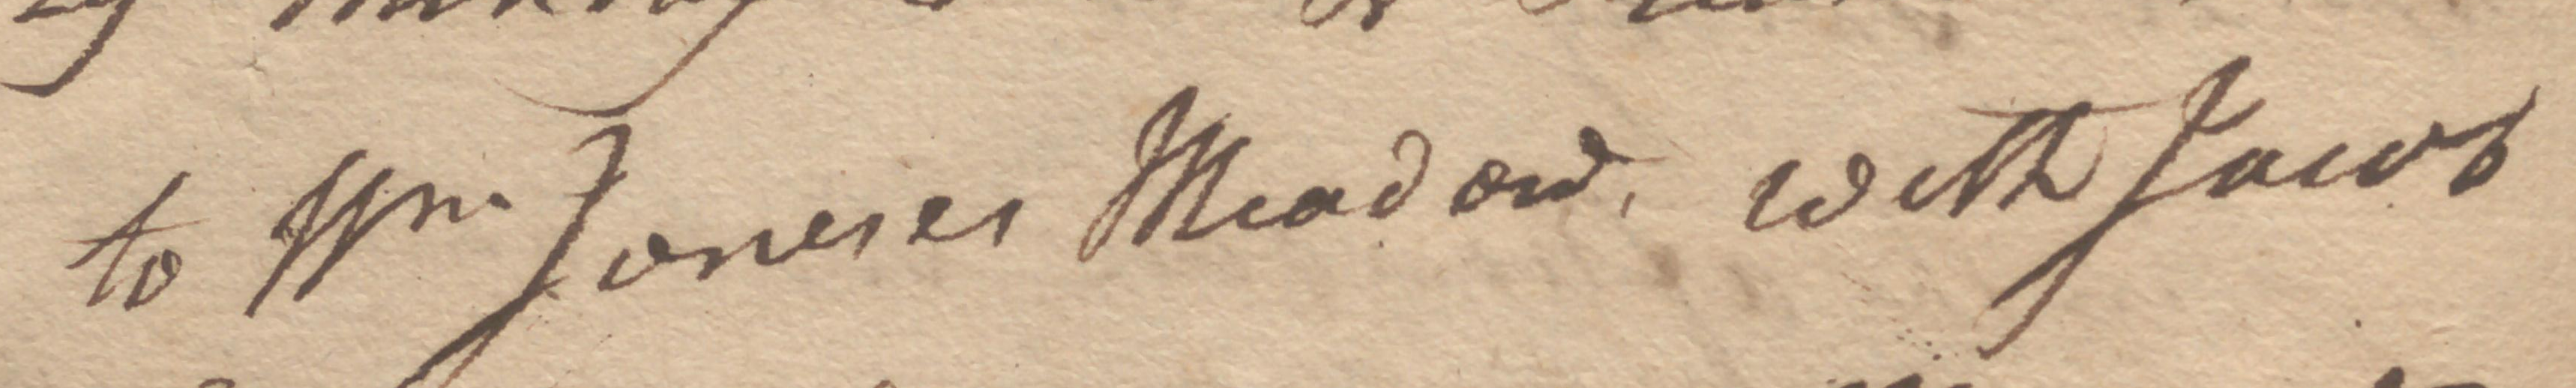to W^m. Joneses Meadow, with Jacob
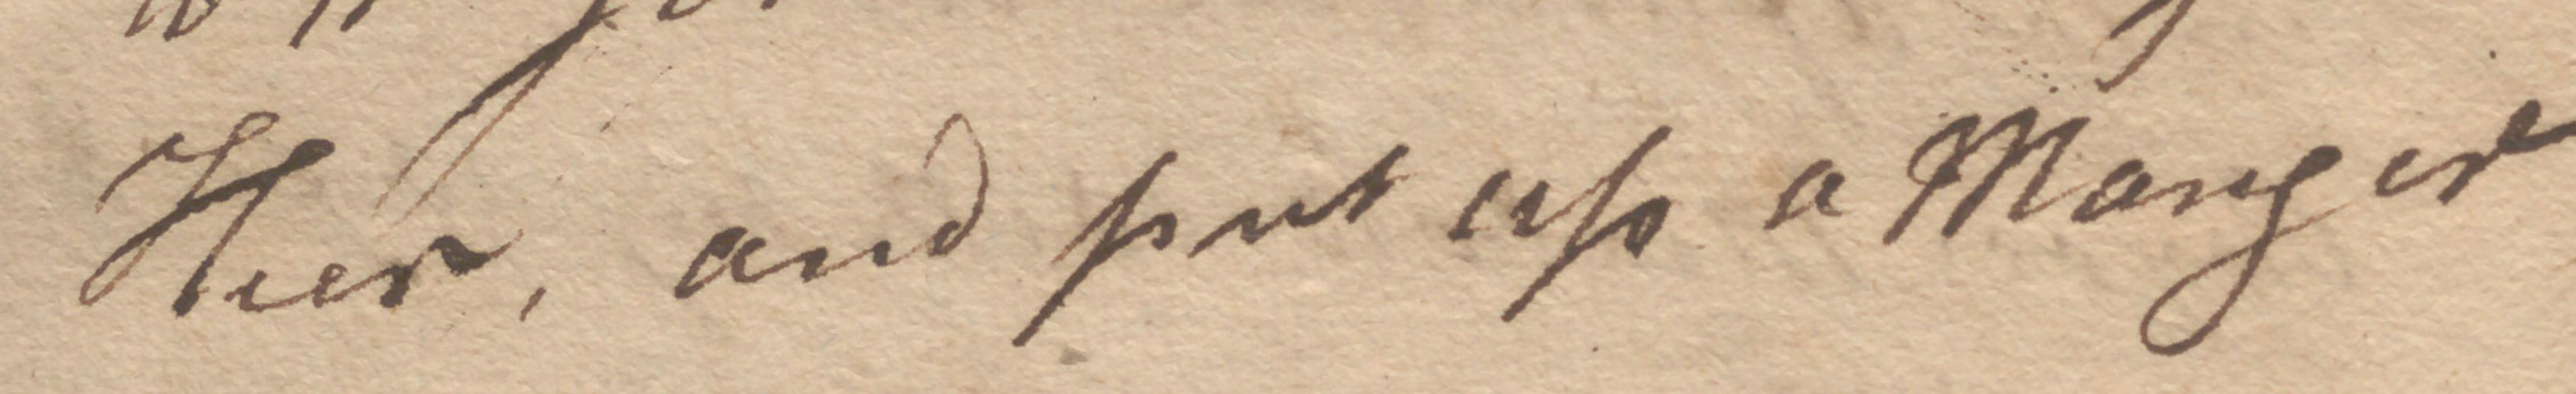Heer, and put up a Manger
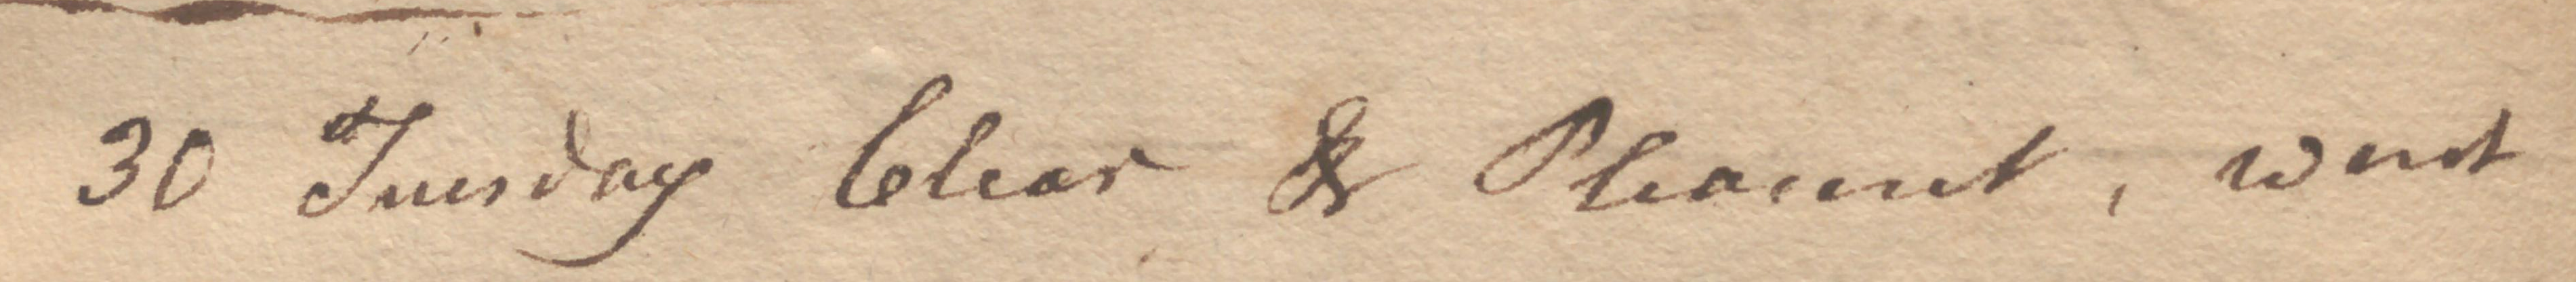30 Tuesday Clear & Pleasent, went
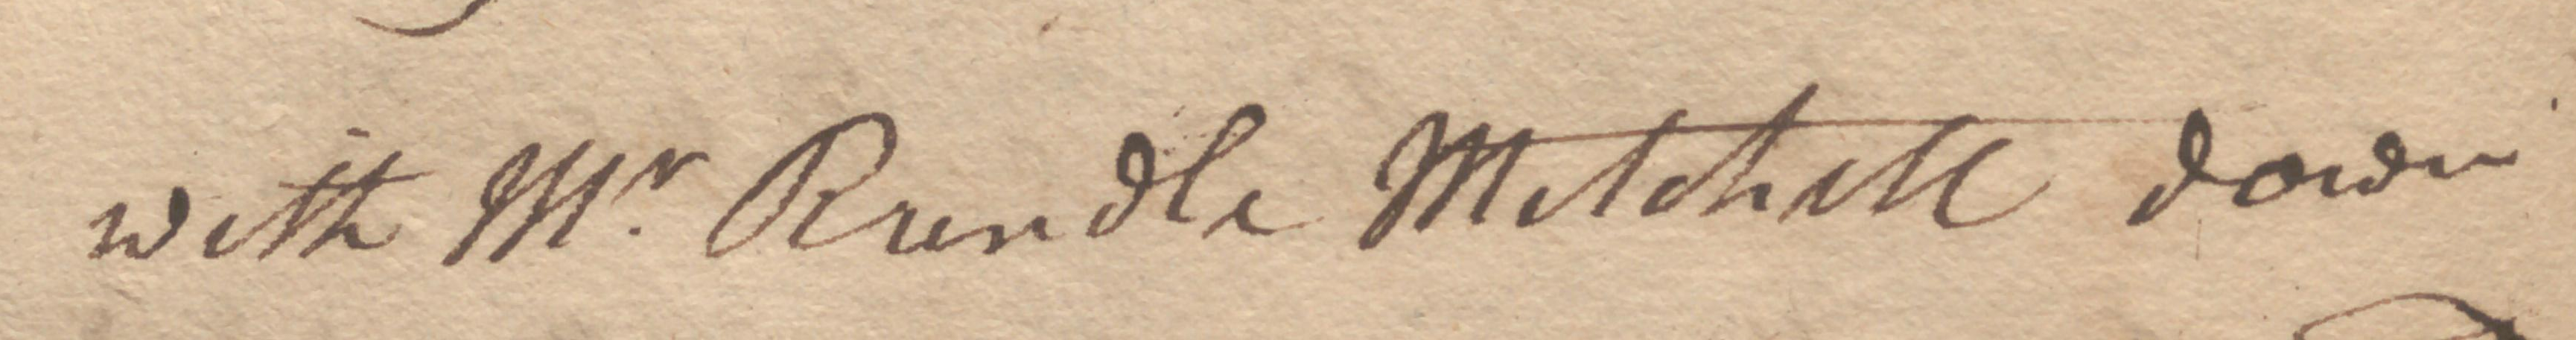with M^r. Rundle Mitchell down
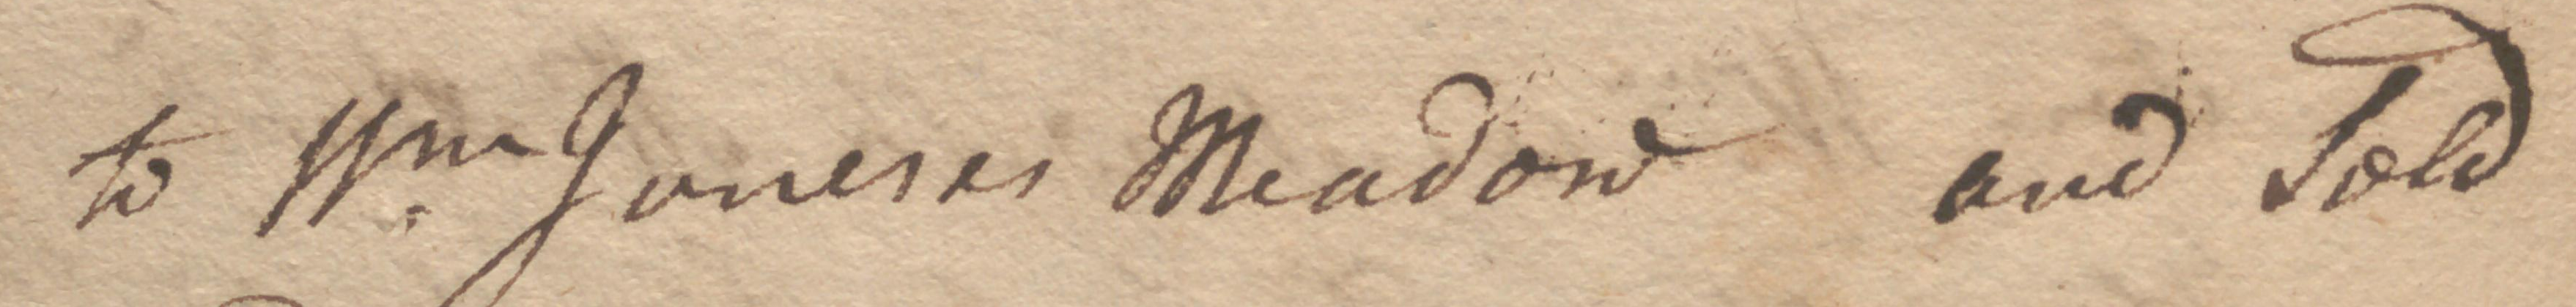to W^m. Joneses Meadow and sold
